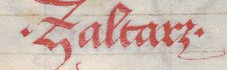.Żaltarz.
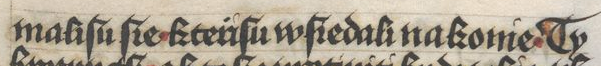maliſu ſie.kteṙiſu wſiedali na konie.Ty
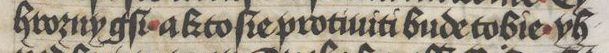hrozny gſi.a kto ſie protiuiti bude tobie.yh¬
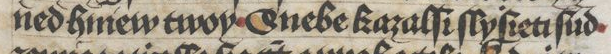ned hniew twoy.Snebe kazalſi ſlyẛieti ſud.
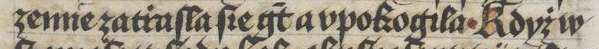zemie zatṙaſla ſie ḡt a vpokogila.Kdyż w¬
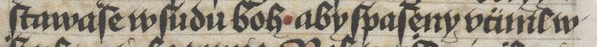ſtawaẛe wſudu boh.Aby ſpaſeny vċinil w¬
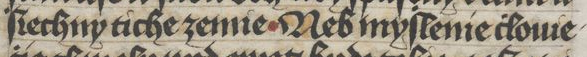ẛiechny tiche zemie.Neb myẛleníe ċlouie¬
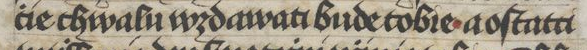ċíe chwalu wzdawati bude tobie.aoſtatci
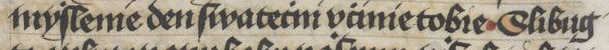myẛlenie den ſwateċni vċinie tobie.Slibug¬
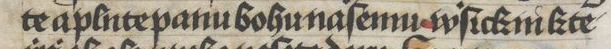te a plnte panu bohu naẛemu.wẛickni kte¬
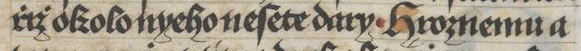ṙiž okolo nyeho neſete dary.Hroznemu a
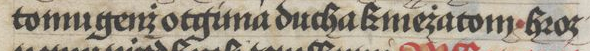tomu genż otgima ducha knieżatom.hroz¬
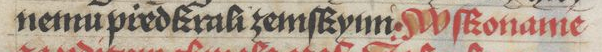nemu pṙedkrali zemſkymi.Wſkonanie
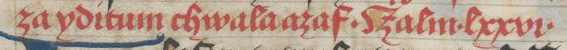za yditum chwala azaf.Żalm.lxxvi.
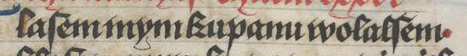laſem mym kupanu wolalſem
